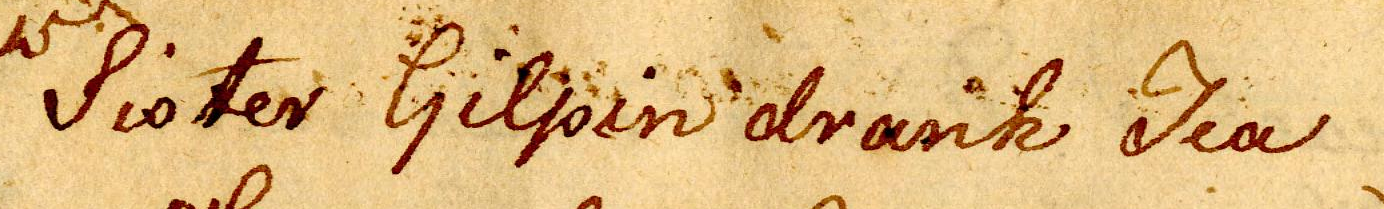Sister Gilpin drank Tea
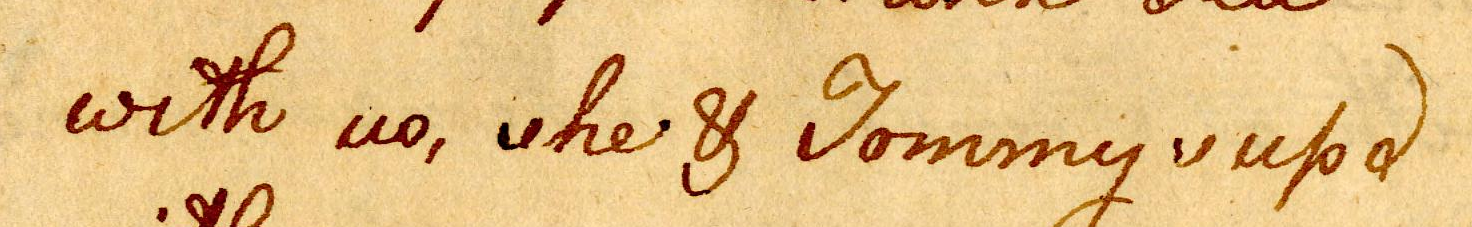with us, she & Tommy supd
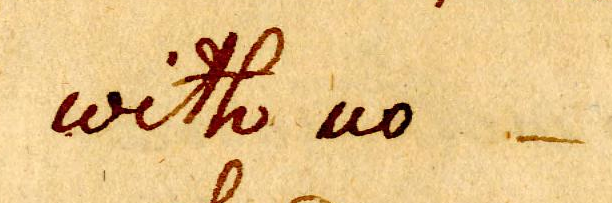with us-
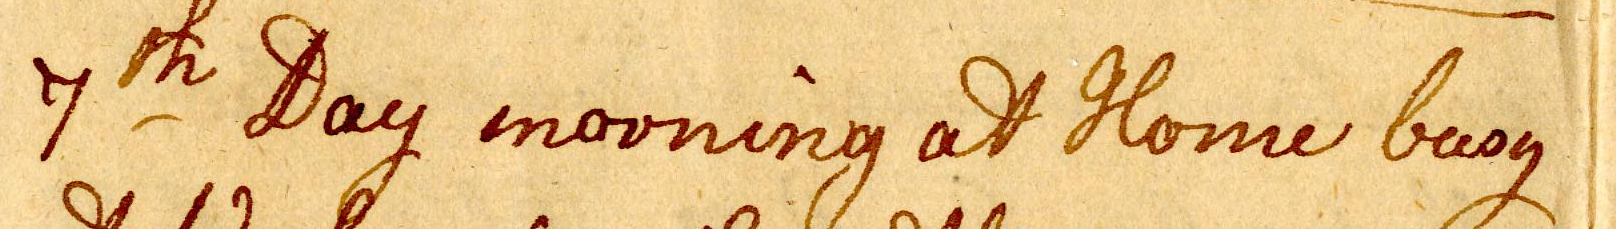7^th Day morning at Home busy
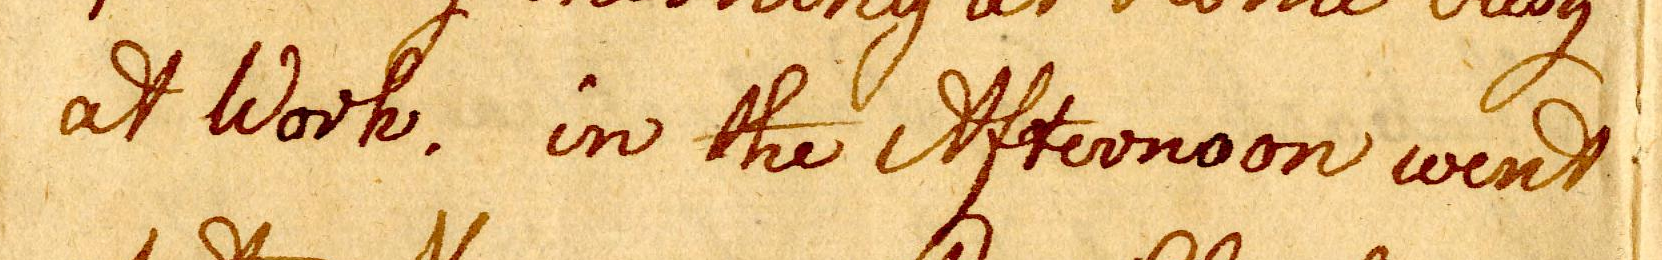at Work, in the Afternoon went
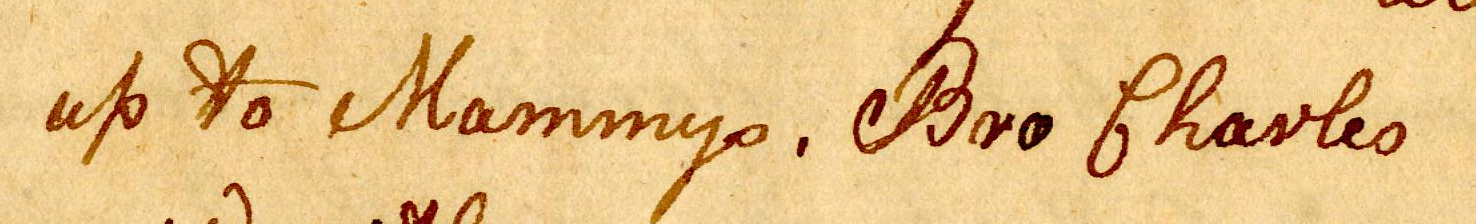up to Mammys, Bro Charles
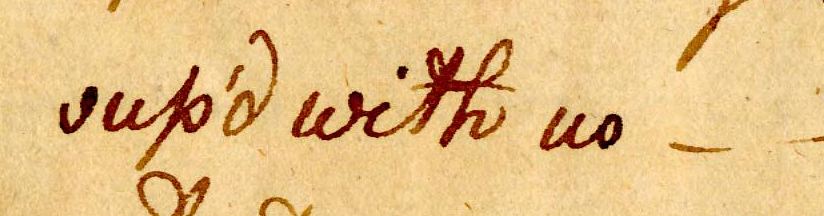sup'd with us-
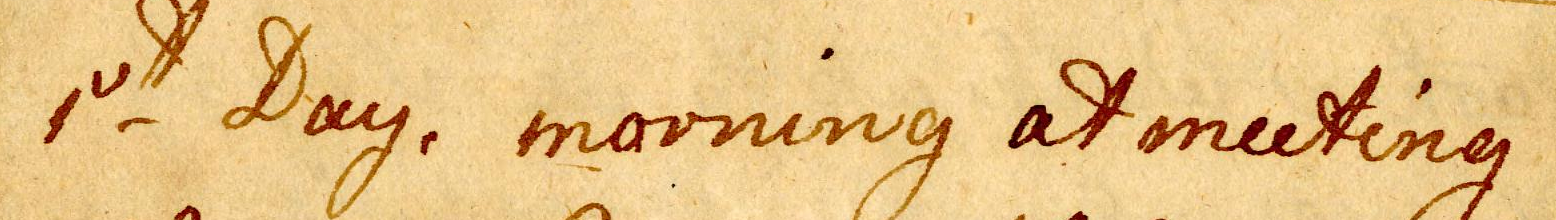1^st Day, morning at meeting
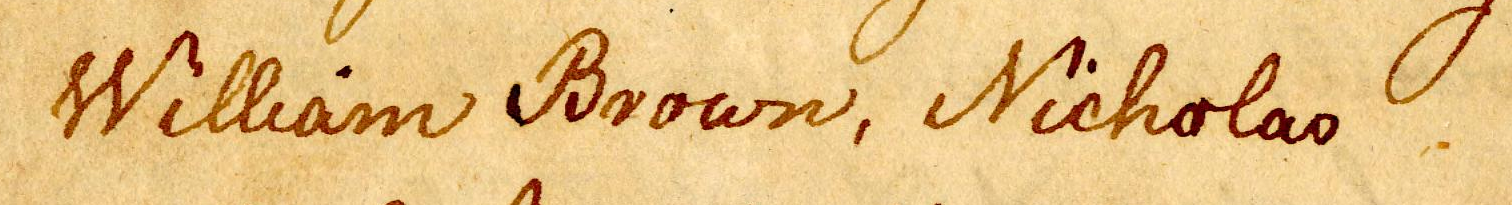William Brown, Nicholas
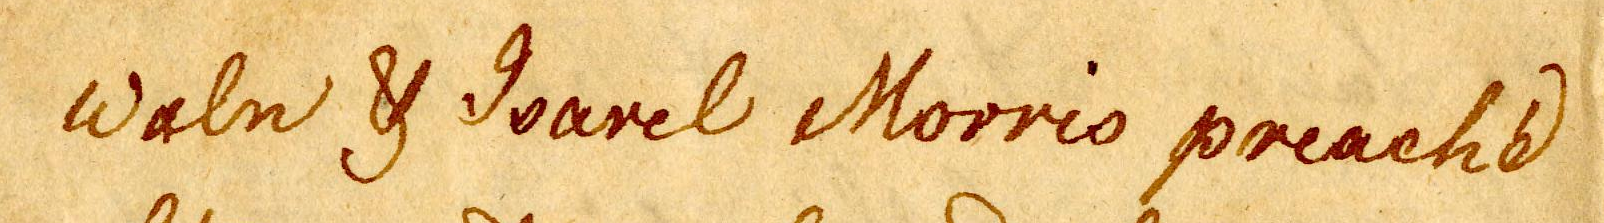Waln & Isarel Morris preach'd
